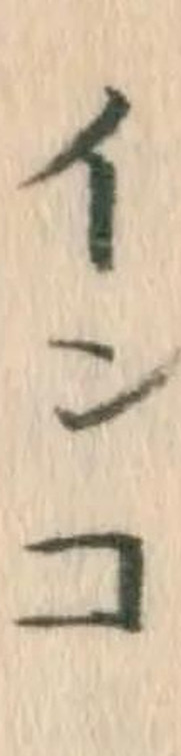インコ
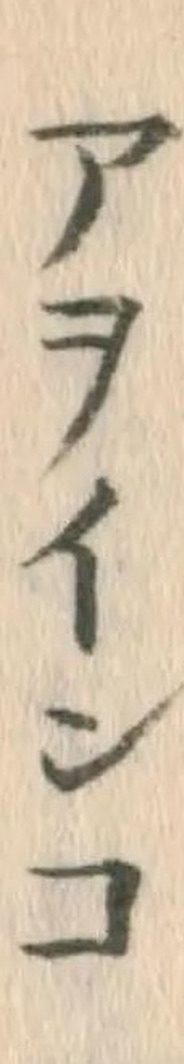アヲインコ
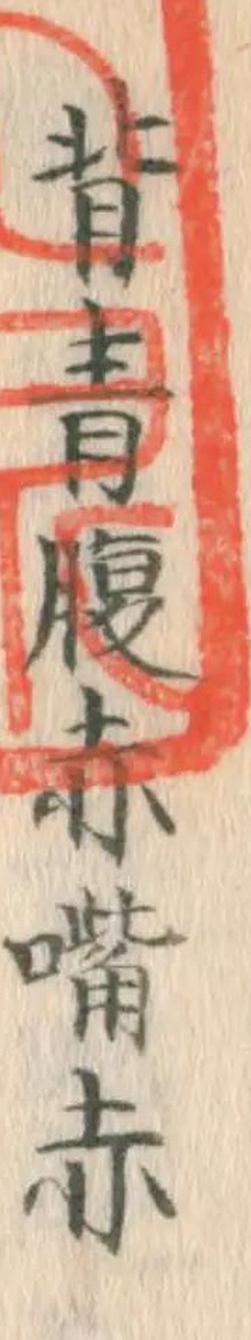背青腹赤嘴赤
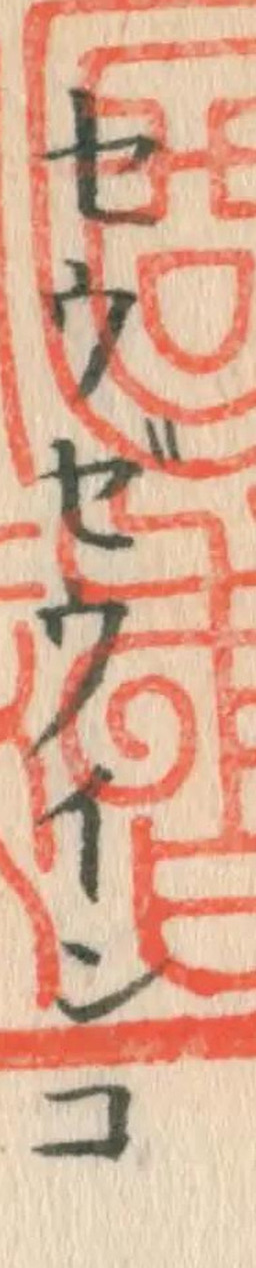セウゼウインコ
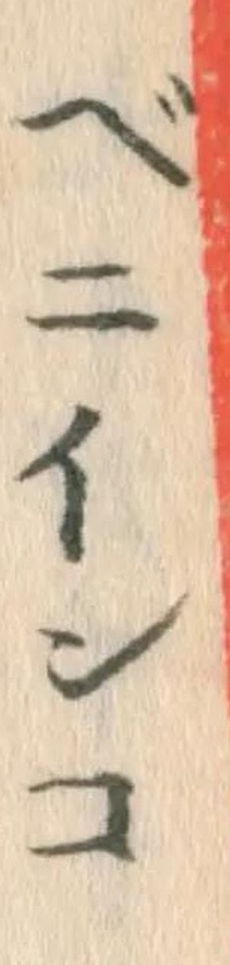ベニインコ
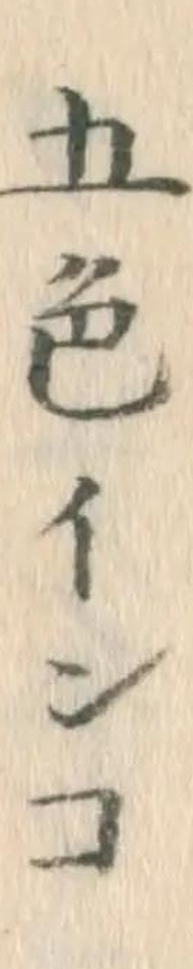五色インコ

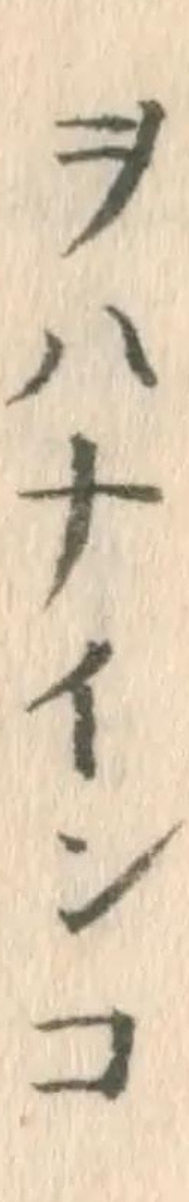ヲハナインコ
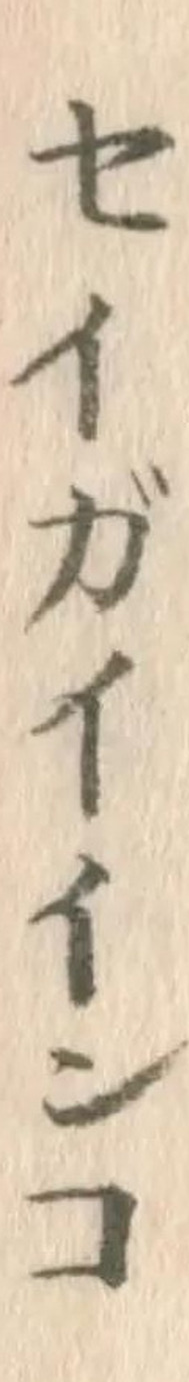セイガイインコ
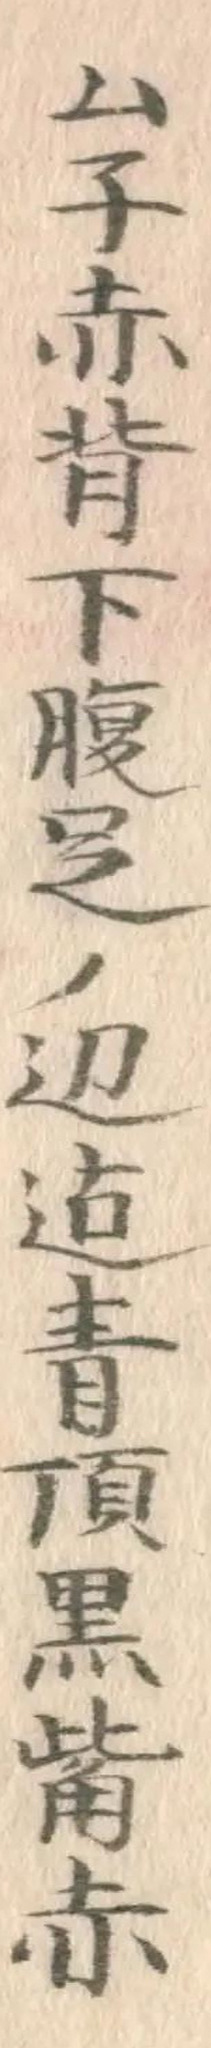ムネ赤背下腹足ノ辺迄青頂黒觜赤
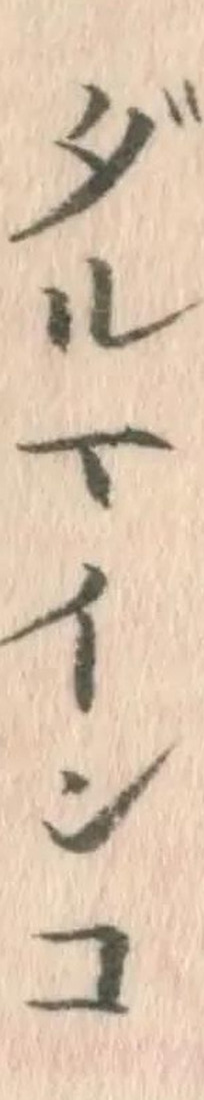ダルマインコ
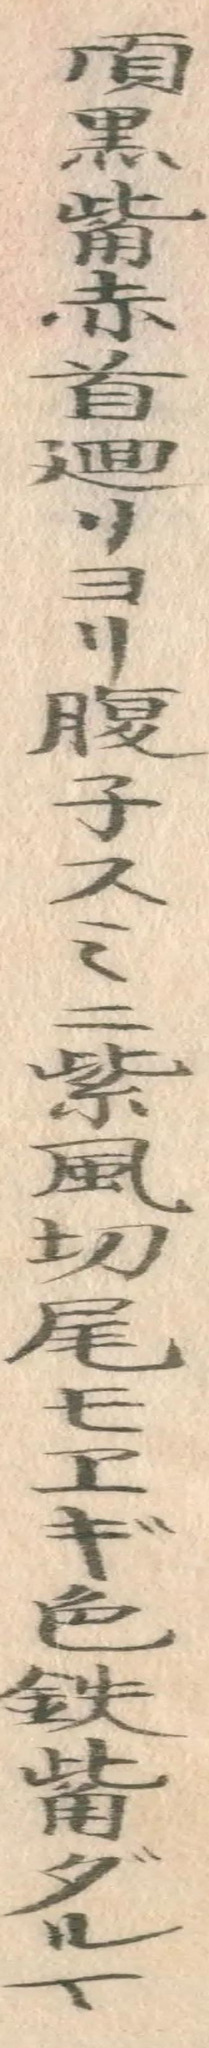頂黒觜赤首廻リヨリ腹ネスミ紫風切尾モヱギ色鉄觜ダルマ
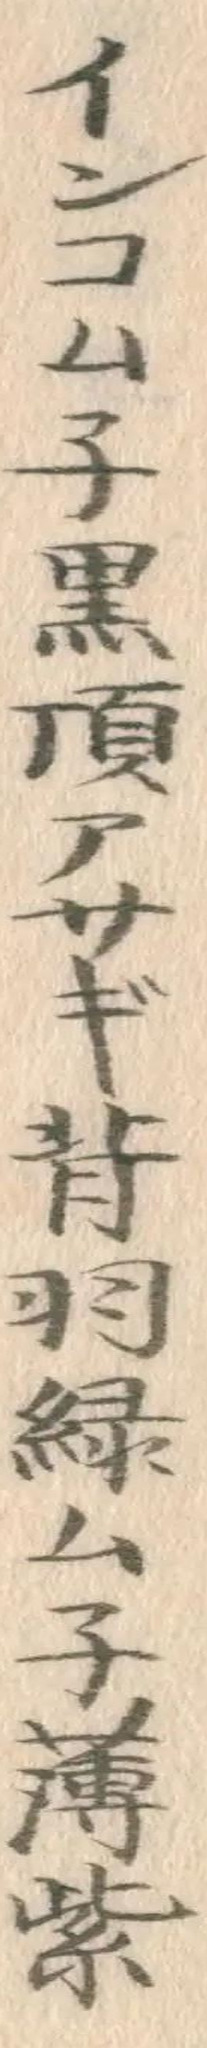インコムネ黒頂アサギ背羽緑ムネ薄紫
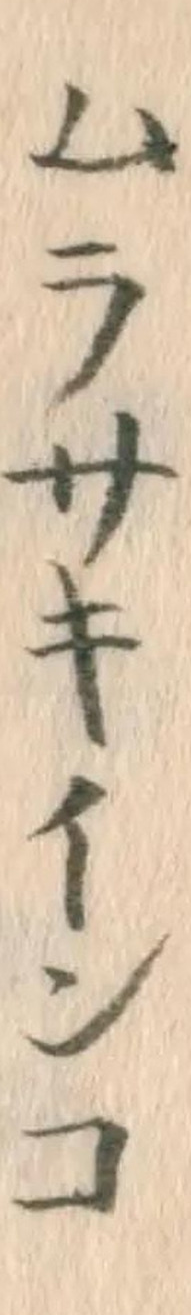ムラサキインコ
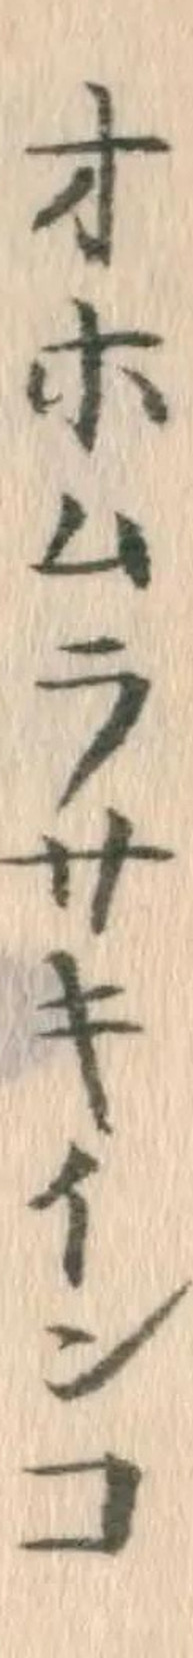オホムラサキインコ
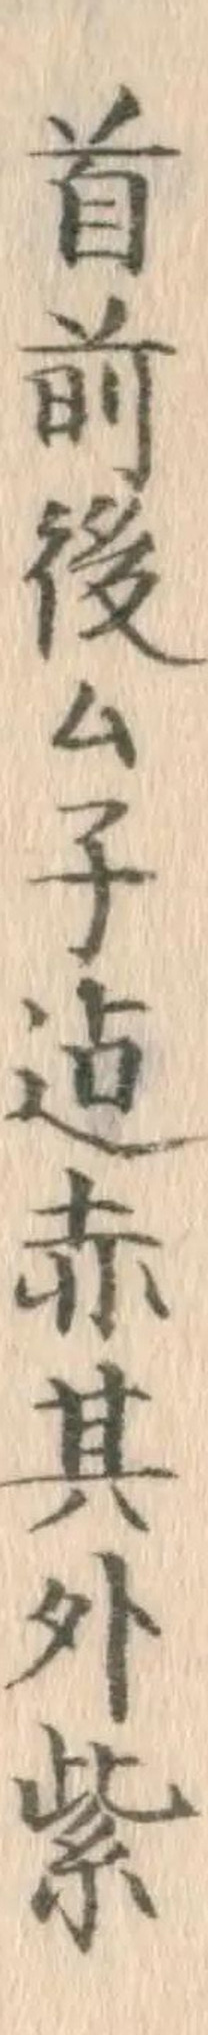首前後ムネ迄赤其外紫
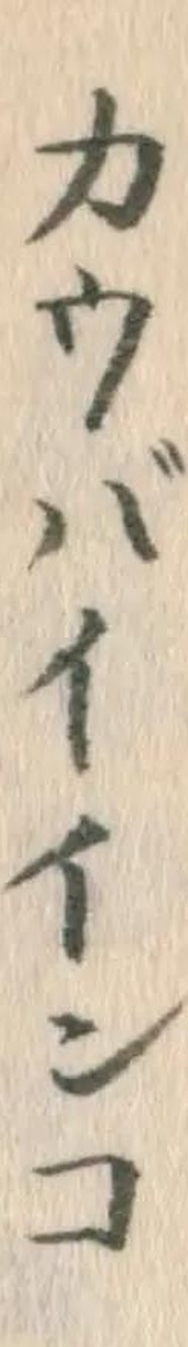カウバイインコ
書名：水谷禽譜. [1]
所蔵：国立国会図書館 National Diet Library, JAPAN
